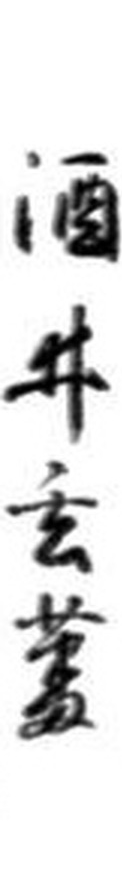酒井玄蕃
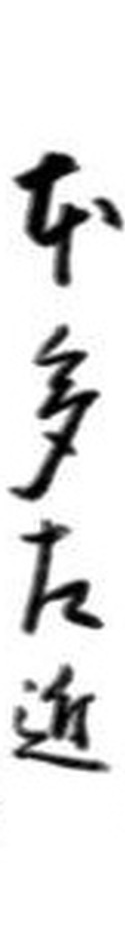本多左近
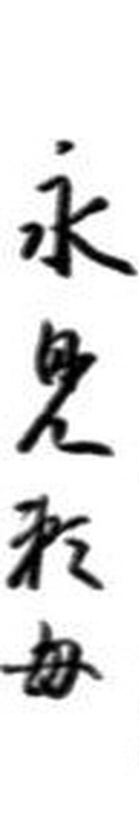永見頼母
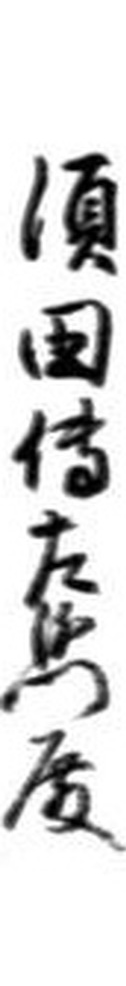須田伝左衛門殿
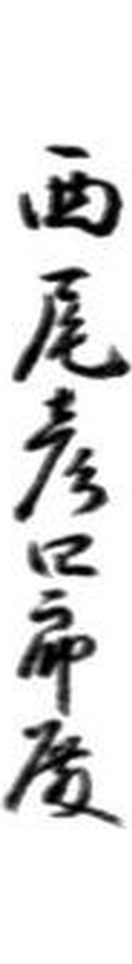西尾彦四郎殿
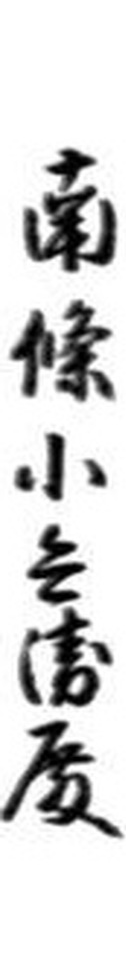南条小兵衛殿

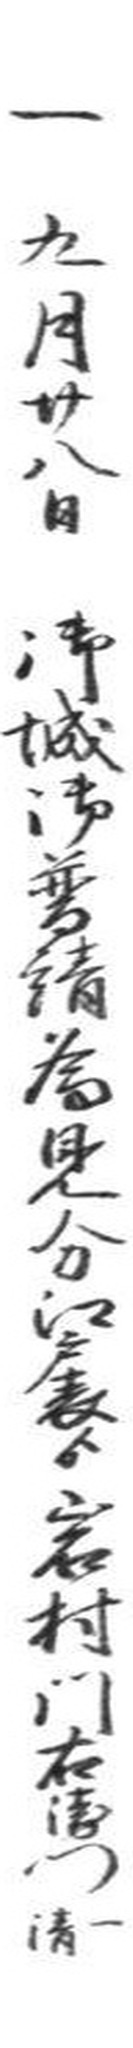一九月廿八日御城御普請為見分江戸表ゟ岩村門右衛門一清
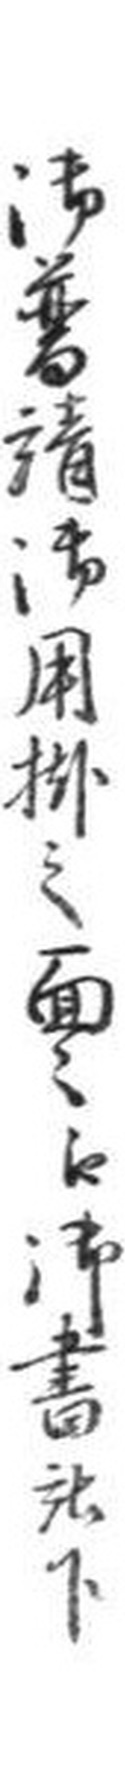御普請御用掛之面々江御書被下
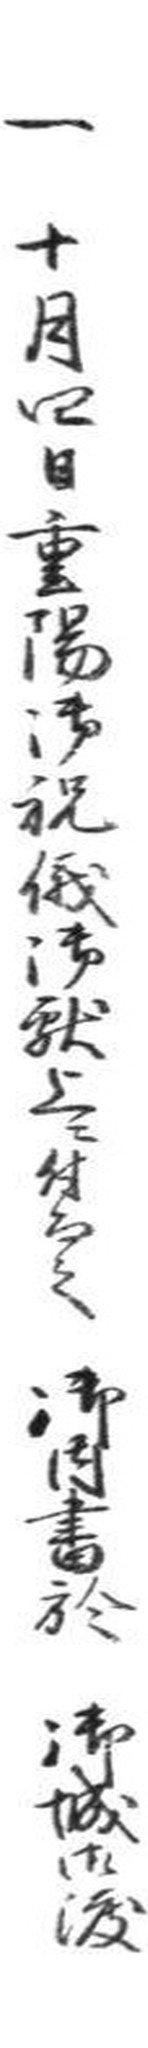一十月四日重陽御祝儀御献上ニ付而之御内書於御城御渡
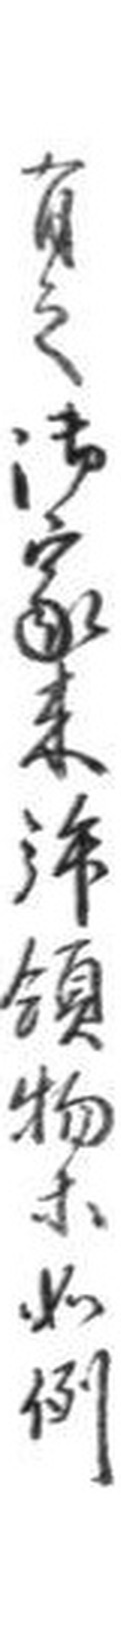有之御家来拝領物等如例
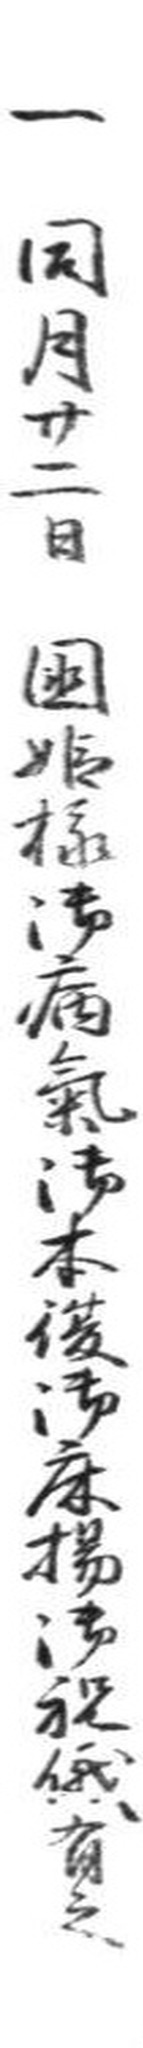一同月廿二日国姫様御病気御本復御床揚御祝儀有之
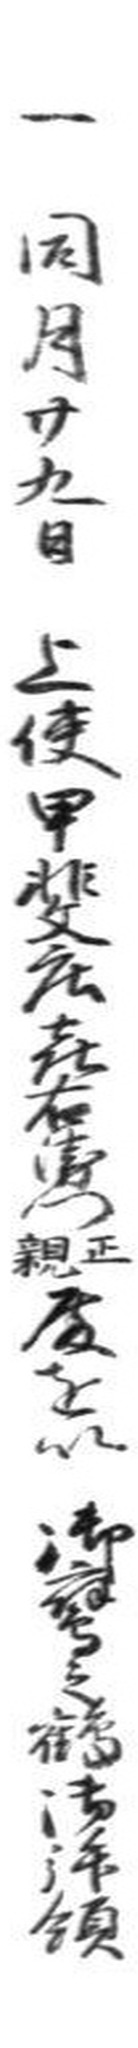一同月廿九日上使甲斐庄喜右衛門正親殿を以御鷹之鶴御拝領
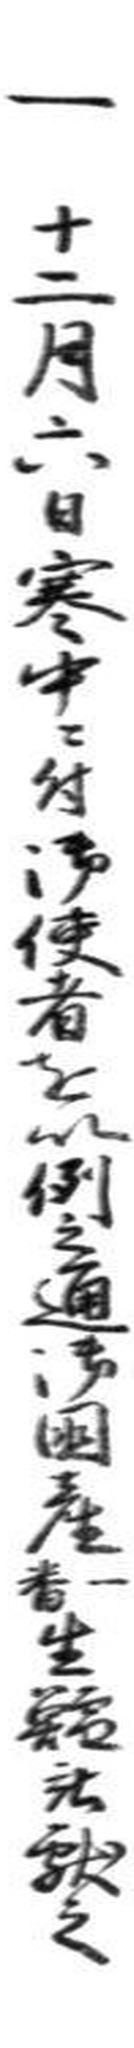一十二月六日寒中ニ付御使者を以例之通御国産一番生鱈被献之
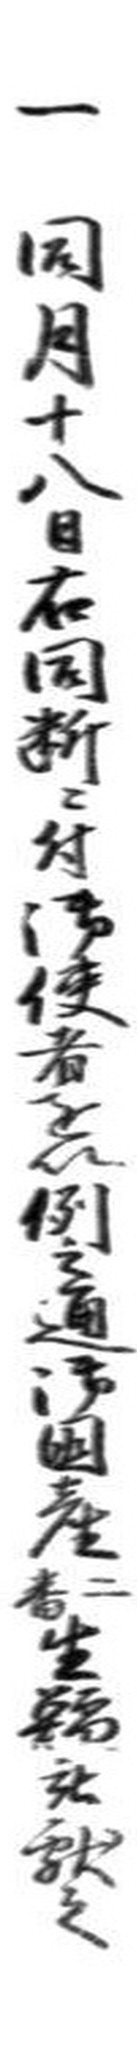一同月十八日右同断ニ付御使者を以例之通御国産二番生鱈被献之
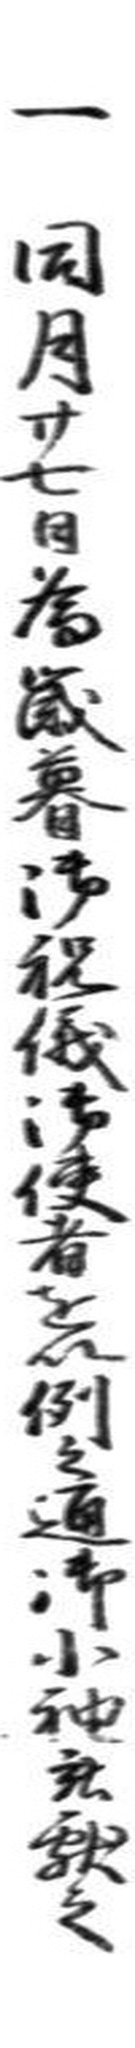一同月廿七日為歳暮御祝儀御使者を以例之通御小袖被献之

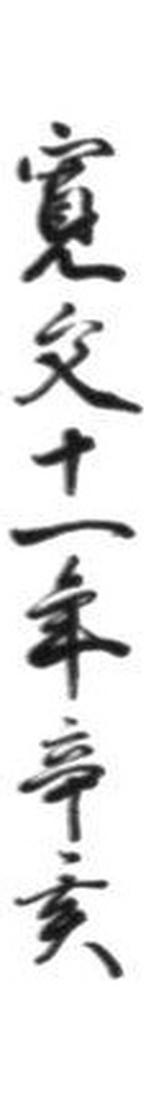寛文十一年辛亥
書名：家譜 八 光通公 従寛文十年到同十二年
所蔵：福井県文書館 Fukui Prefectural Archives
